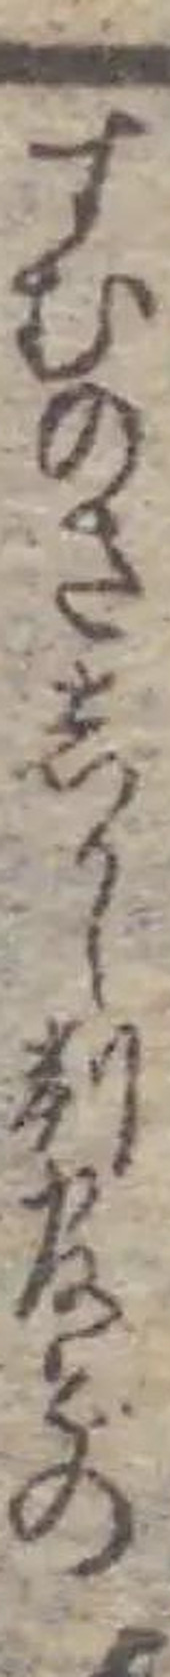すむのさしかし判官どの
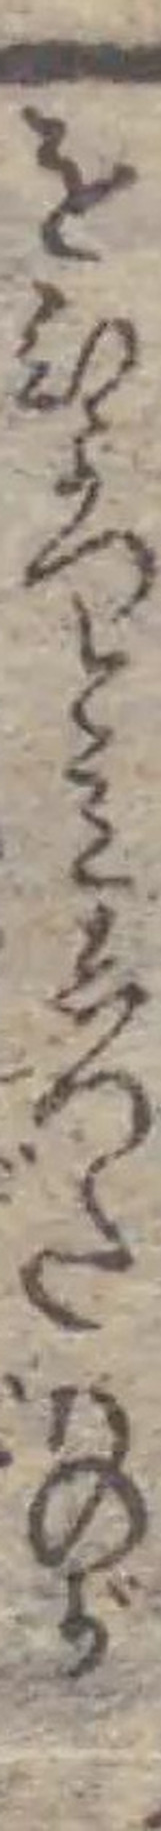をひよつとみしつたはのが
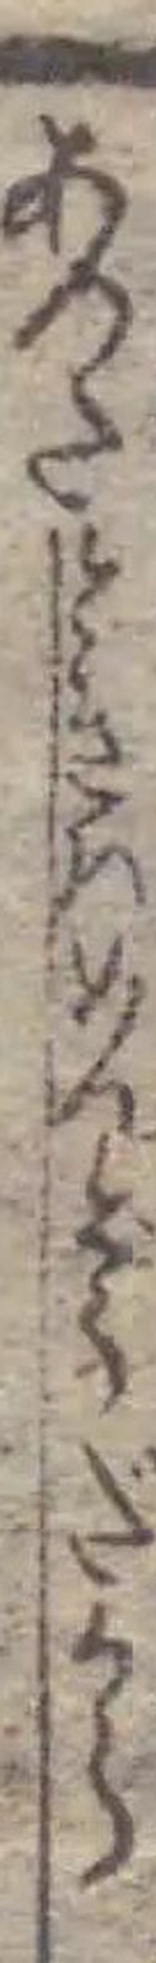あつたときはめんどうだから
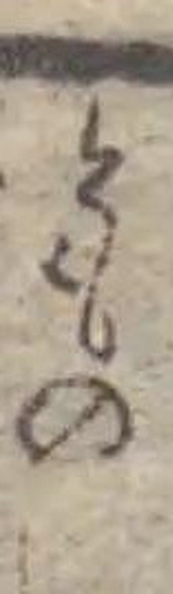ともの
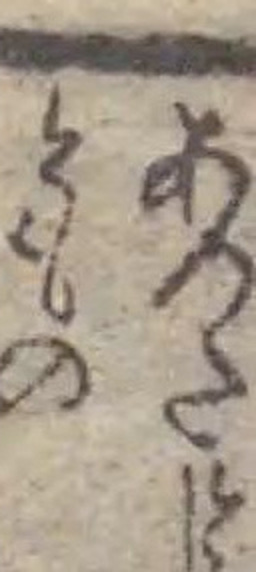ともの
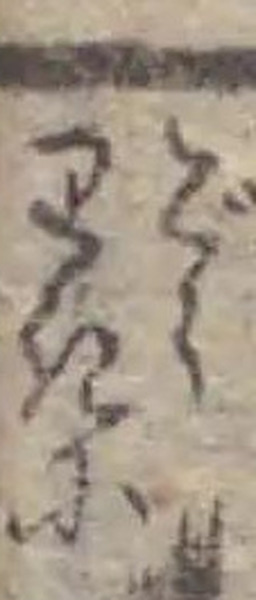りきに
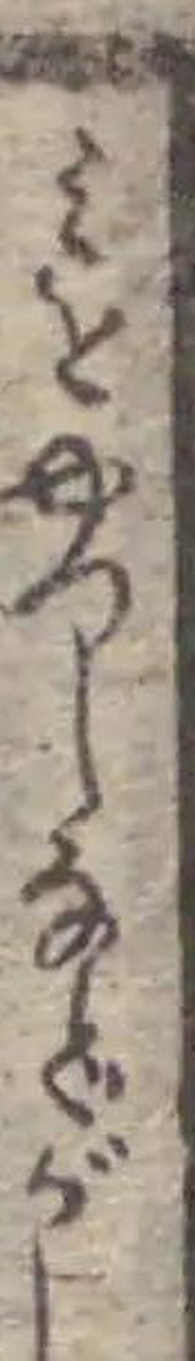みをやつしなどが
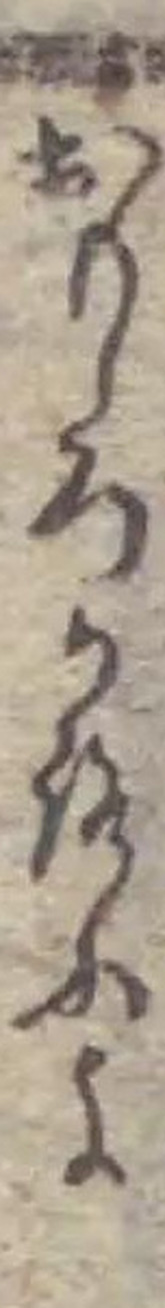おもしろかろふよ
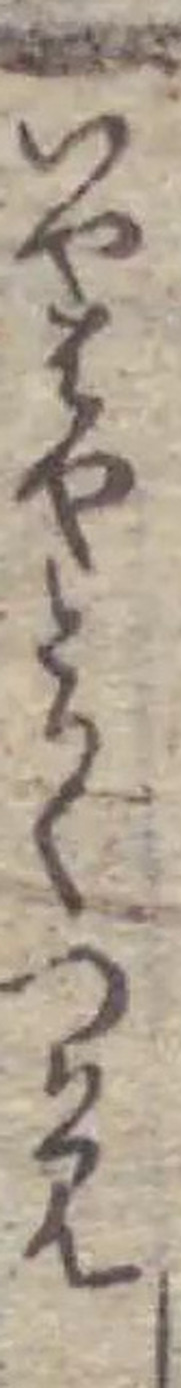いやはやとかくつかみ
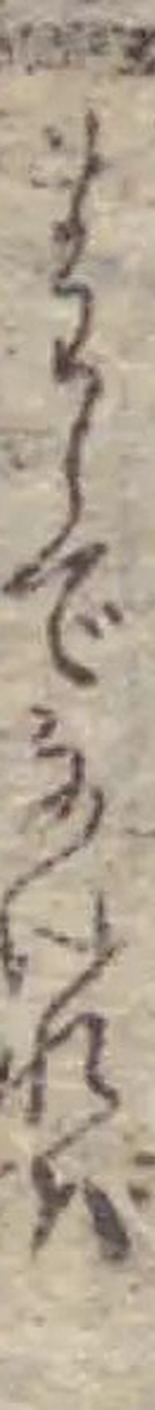まわしでなければ
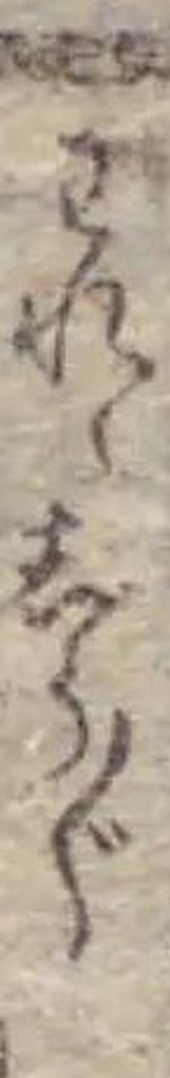われらしう〴〵
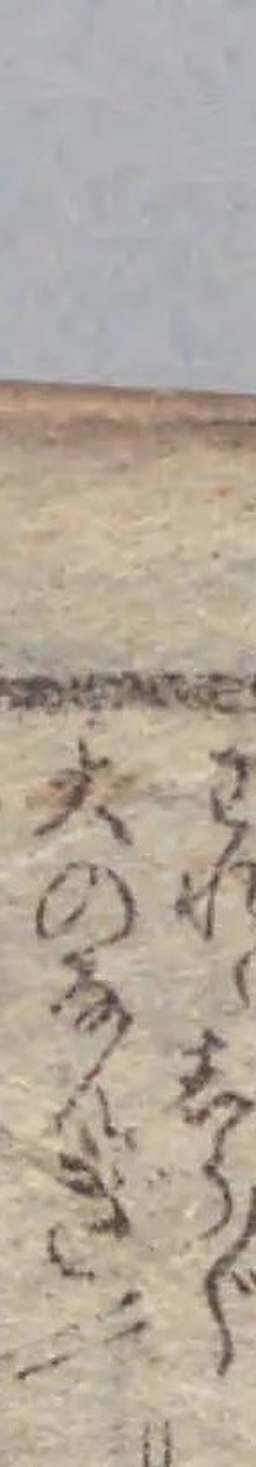大のなんぎ
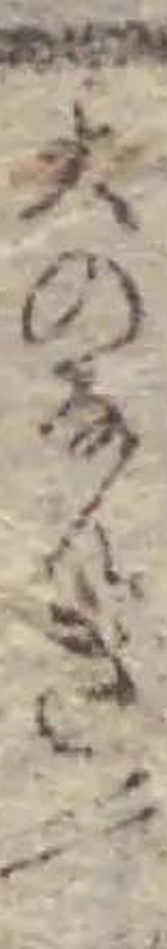大のなんぎ
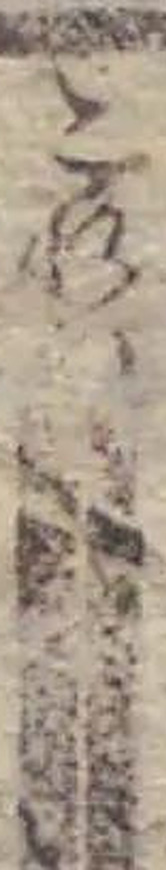これは
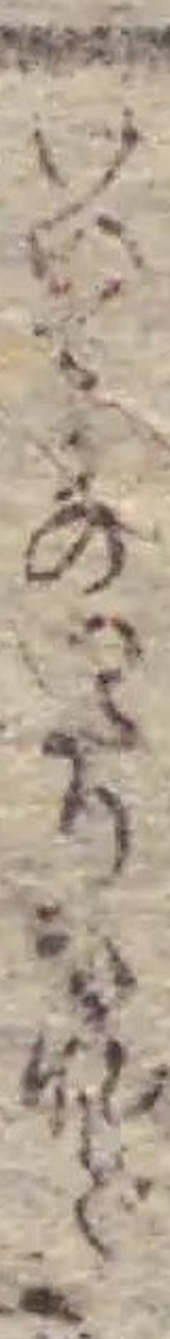けいてうのいたりれど
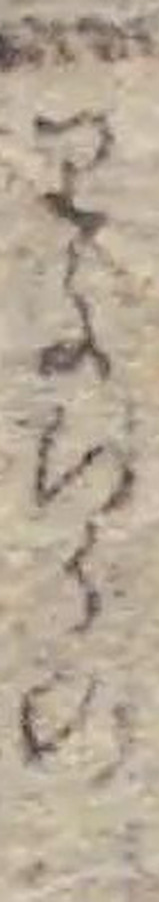りよちうの
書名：通増安宅関 2巻
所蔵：国立国会図書館 National Diet Library, JAPAN
